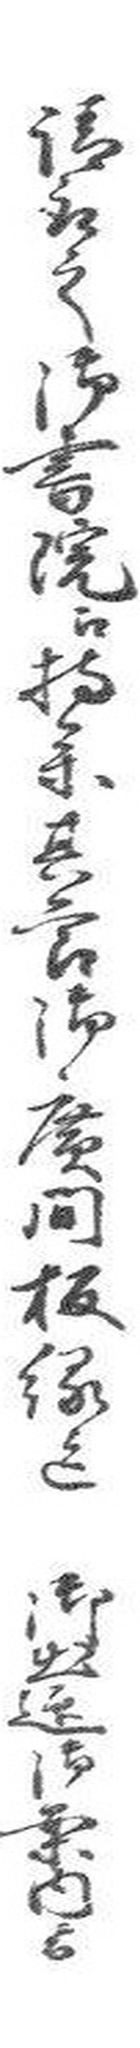請取之御書院江持参其節御広間板縁迄御出迎御案内ニ而
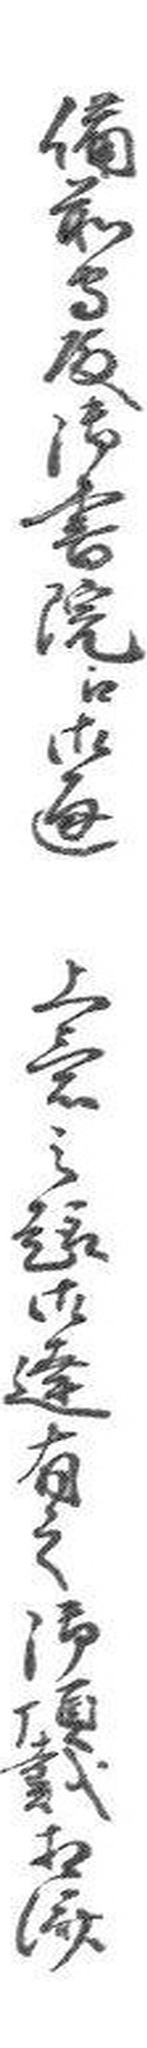備前守殿御書院江御返上意之趣御達有之御頂戴相済
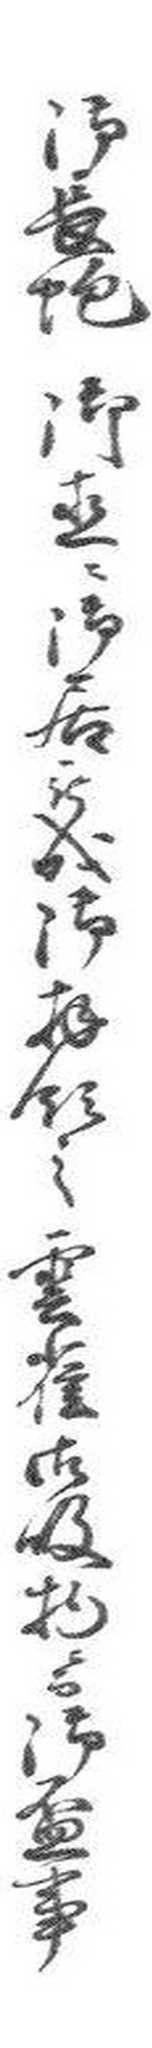御長蚫御直ニ御居被成御拝領之雲雀御吸物ニ而御盃事
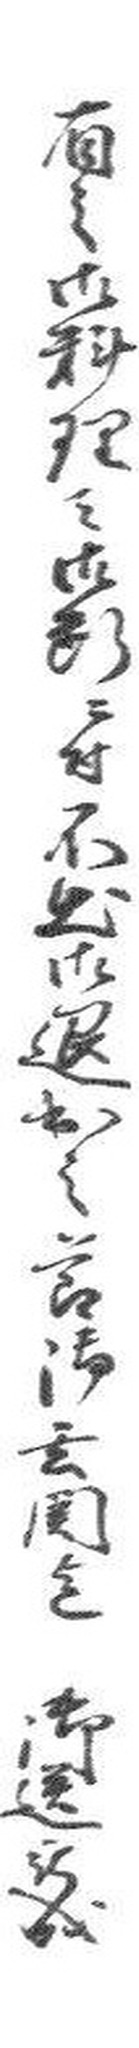有之御料理を御断ニ付不出御退出之節御玄関迄御送被成
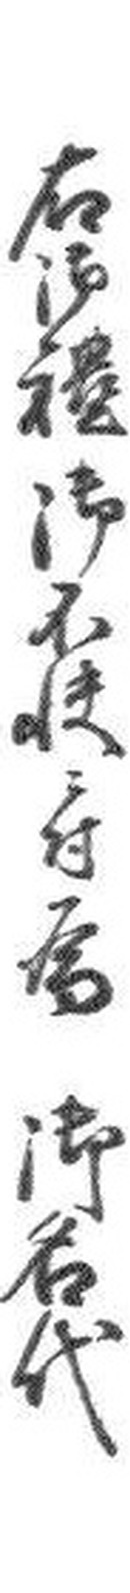右御礼御不快ニ付為御名代
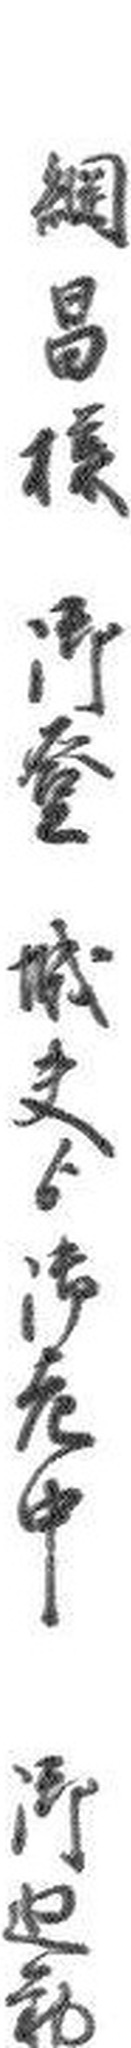綱昌様御登城夫ゟ御老中御廻勤
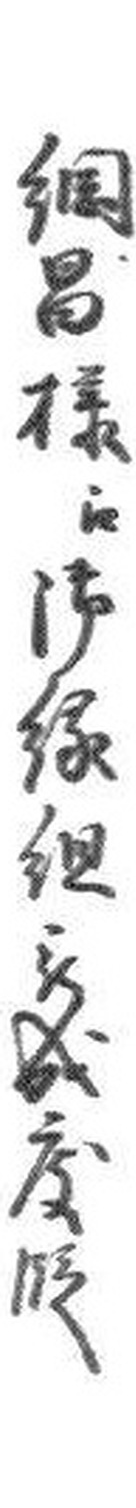綱昌様江御縁組被成度段
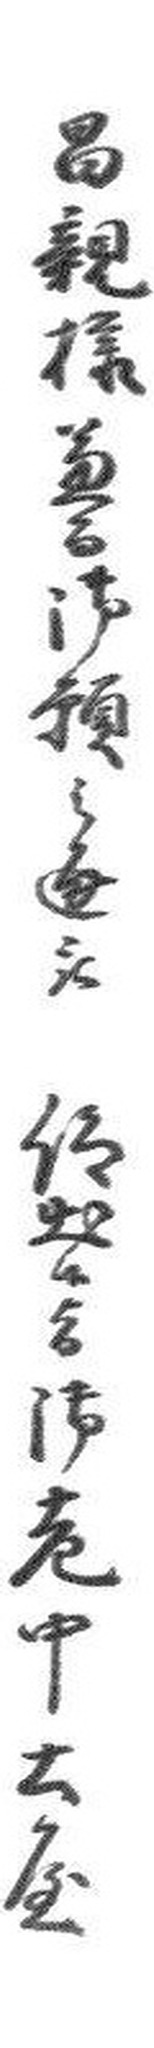昌親様兼而御願之通被仰出候旨御老中土屋
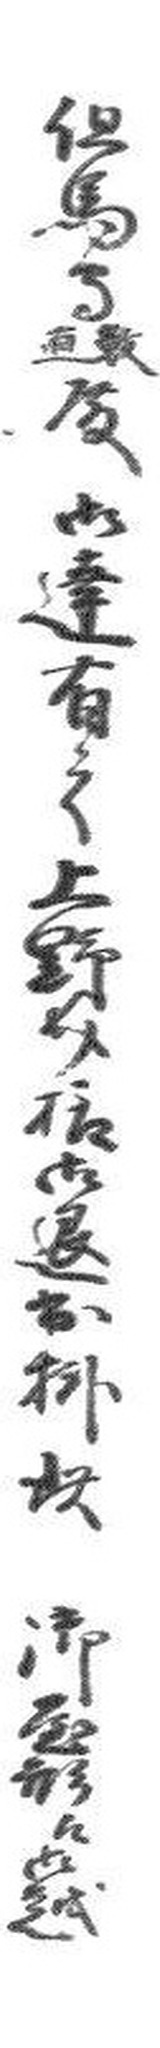但馬守直殿御達有之上野介様御退出掛此御屋形江御越
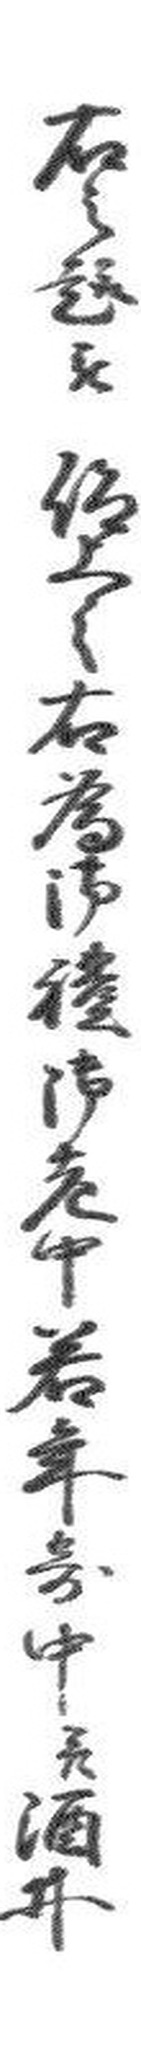右之趣被仰上之右為御礼御老中若年寄中幷酒井
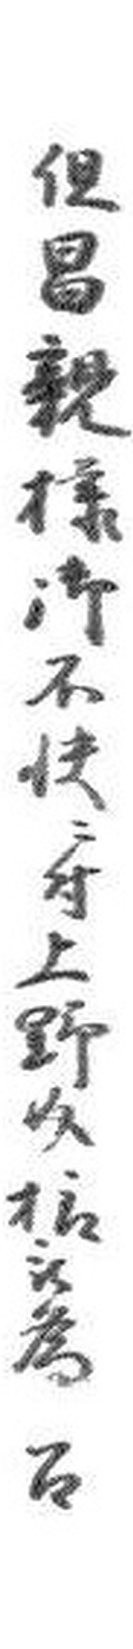但昌親様御不快ニ付上野介様被為召ヽ

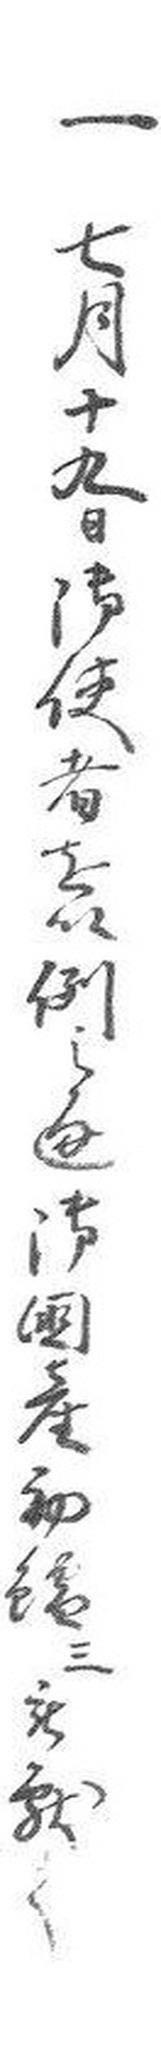一七月十九日御使者を以例之通御国産初鱈三被献之
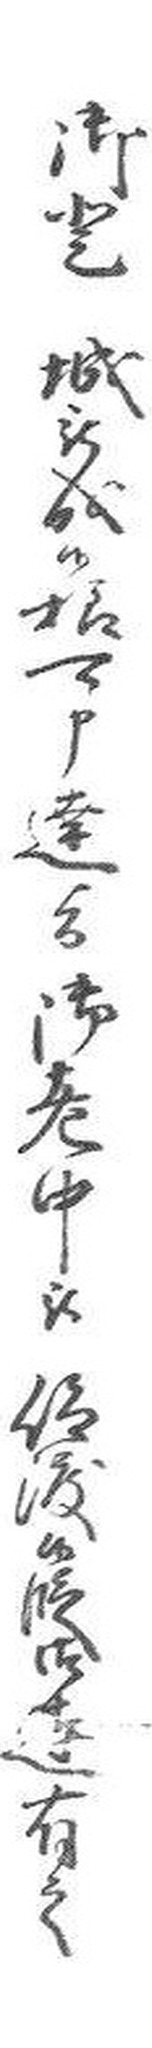御登城被成候様可申達旨御老中被仰渡候段御達有之
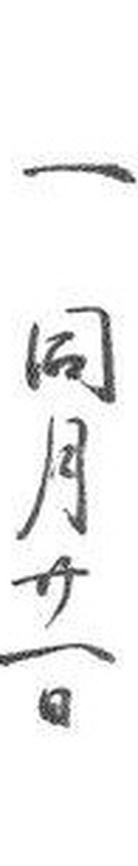一同月廿一日
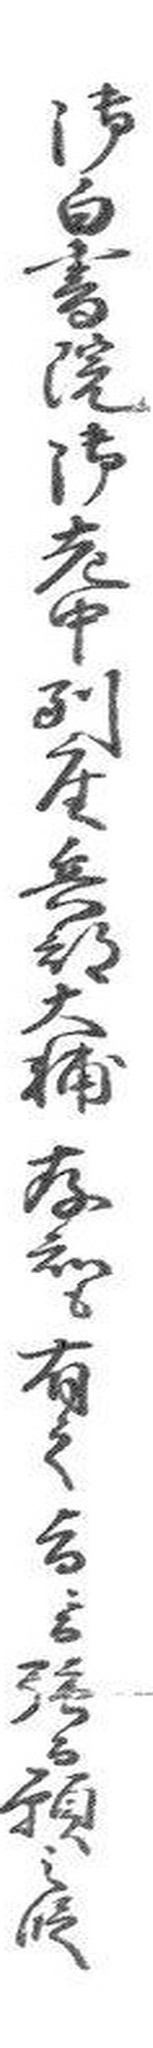御白書院御老中列座兵部太夫存知も有之旨ニ而強而願之段
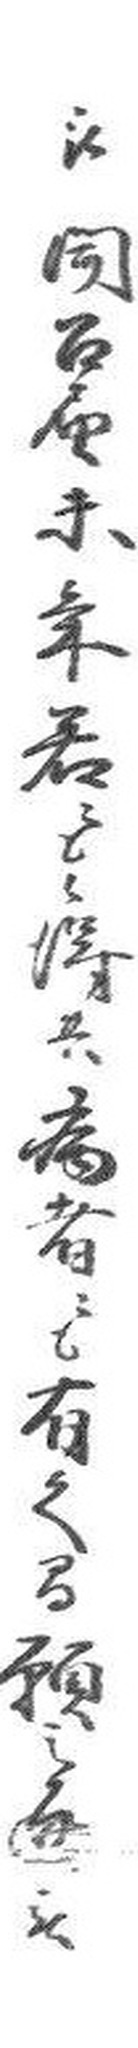被聞召届未年若ニも候得共病者ニも有之間願之通被
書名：家譜 十一 昌親公 従延宝二年到延宝四年八月
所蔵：福井県文書館 Fukui Prefectural Archives
